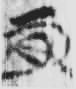○（期）
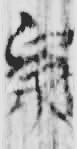○（爨）
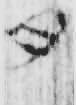月
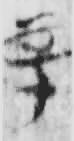辛
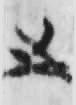之
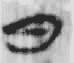日
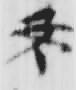不
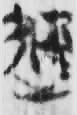𬨭（將）
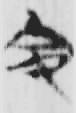○（中）
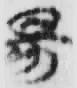昜（陽）
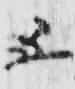之
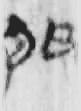門
